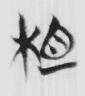相
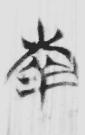南
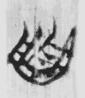面
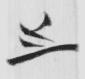之
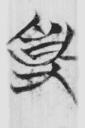事
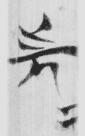先=
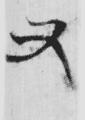又
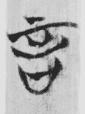言
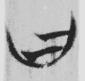曰
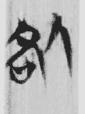咎
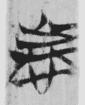者
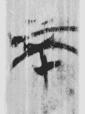不
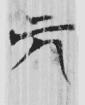元
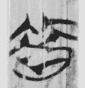昔
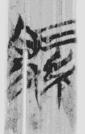{糸馬}
